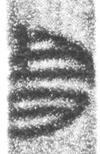周
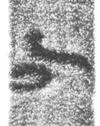公
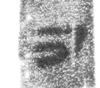曰
